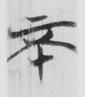不
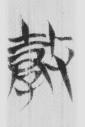{㱿子}
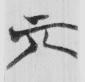亓
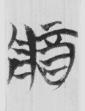𨟻
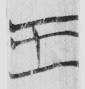王
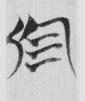於
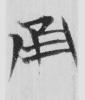甬
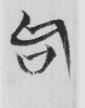句
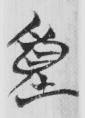重
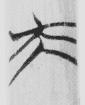夫
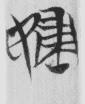婦
